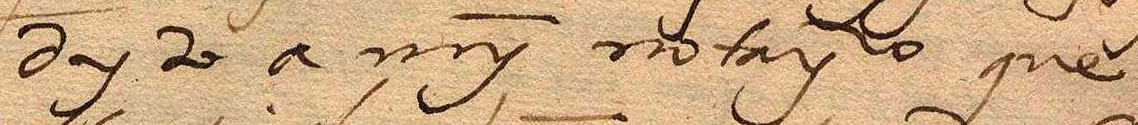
dyto a mȳ notayro que
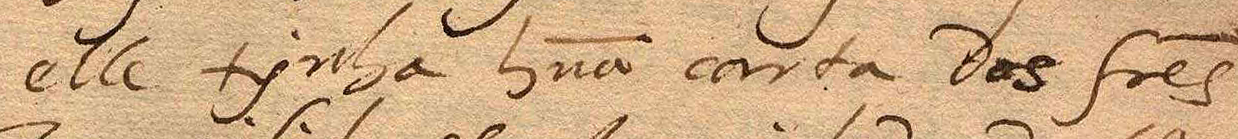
elle tynha hūa carta dos srēs
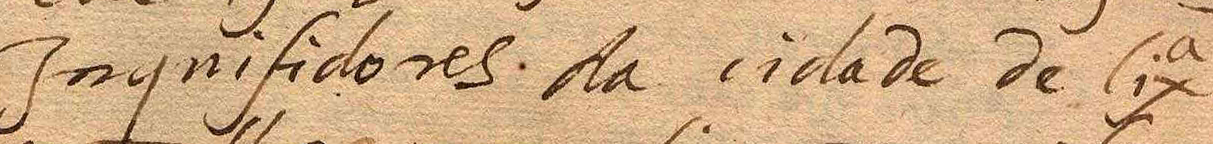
Jnquisidores da cidade de lixa
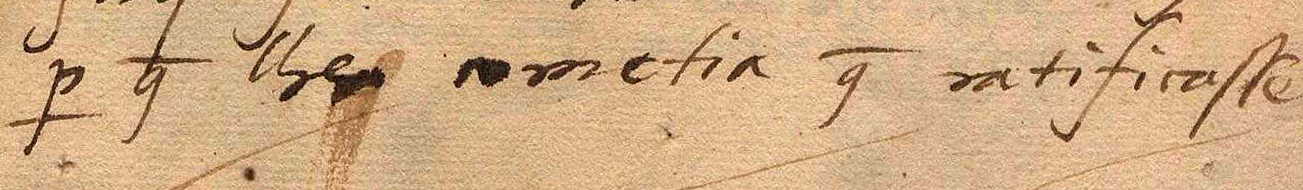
ꝑ q̄ lhe cometia q̄ ratificasse
